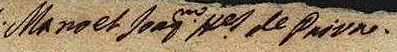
Manoel Joaqm. H.es de Paiva.
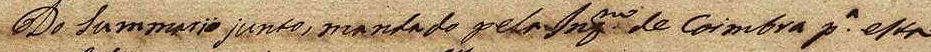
Do Summario junto, mandado pela Inq.m de Coimbra p.a esta
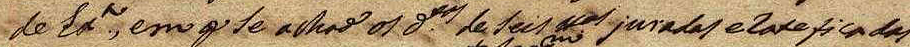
de Lx.a, em q se achaõ os d.tos de seis tt.as juradas e Rateficadas
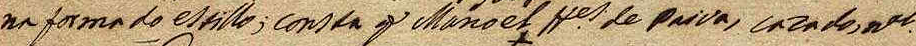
na forma do estillo; consta q̄ Manoel H.es de Paiva, cazado, nal.
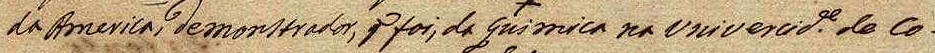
da America, demonstrador, q̄ foi, da Quimica na univercid.e de co
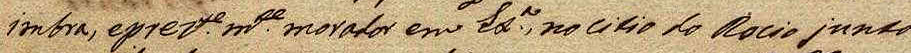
imbra e prez.tem.te morador em Lx.a, no citio do Rocio junto
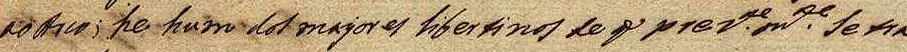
ao Arco; he hum dos mayores libertinos de q̄ prez.tem.te se tra
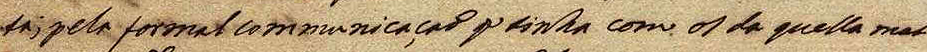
ta; pela formal communicaçaõ q̄ tinha com os daquella mal
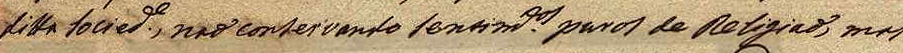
ditta socied.e, naõ conservando sentim.tos puros de Religiaõ, mas
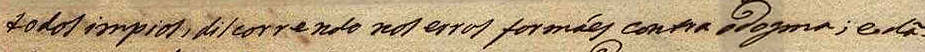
todos impios, discorrendo nos erros formáes conta o dogma; e dã
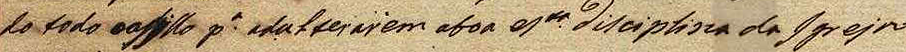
do todo o asjllo p.a adulterarem a boa e s.ta disciplina da Jgreja
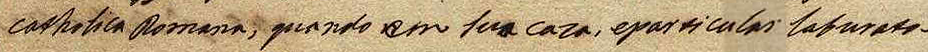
catholica Romana, quando em sua caza, e particular laburato
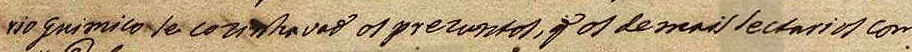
rio quimico se cozinhavaõ os prezuntos, q̄ os demais sectarios com
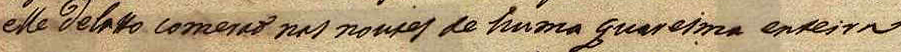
elle delatto comeraõ nas noutes de huma quaresma enteira,
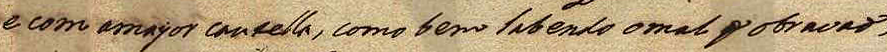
e com a mayor cautella, como bem sabendo o mal q̄ obravaõ,
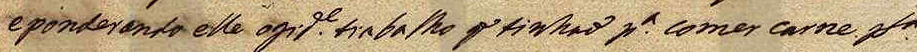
e ponderando elle o grd.e trabalho q̄ tinhaõ p.a comer carne pla
